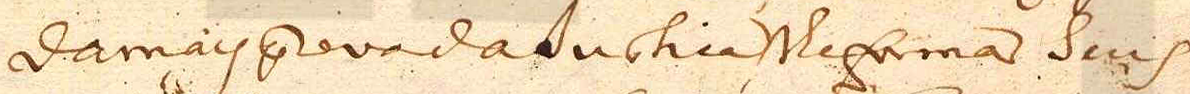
da mais prova da Iustiça, lhe forma Seus
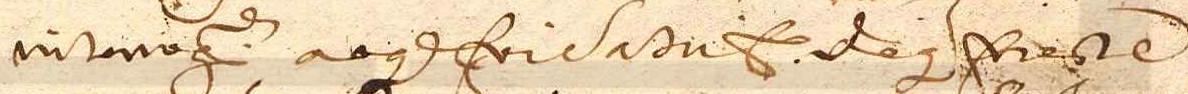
interrog.os ao q̄ foi satif.o de q̄ fiz este
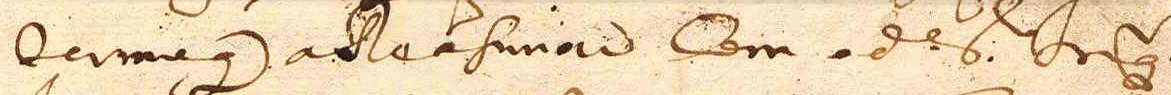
termo q̄ a Re assinou Com o d.o s.r Inq.or
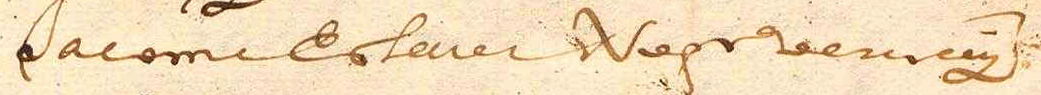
Iacome Esteues Nog.ra o escreuj
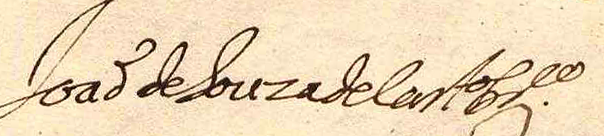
Joaõ de Souza de Cast.ob.r.co
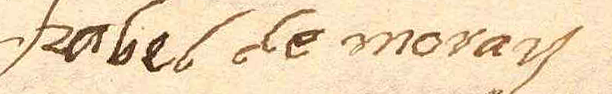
Jsabel de morais
